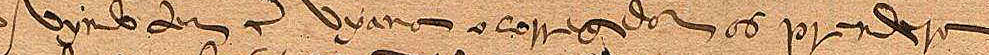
e vyndo ter em Vyana o corregedor os prendera
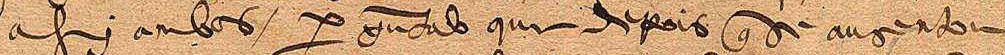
asy ambos / ꝑ gu̅tado que depois q̅ se ausentou
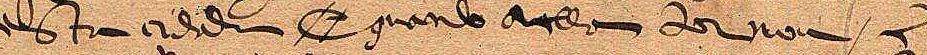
desta cidade _ quando a ella tornou / e̅
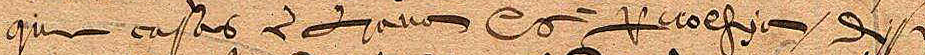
que casas e̅traua e se Recolhya / dyse
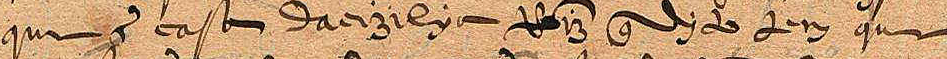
que e̅ casa da cizilya Ro̅iz q̅ dyto tem que
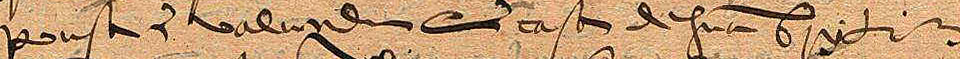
pousa e̅ valuerde e e̅ casa de hu̅a brytiz
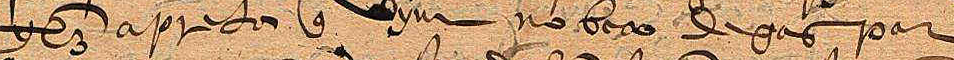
gl̅z a preta q̅ vyue no beco de gaspar
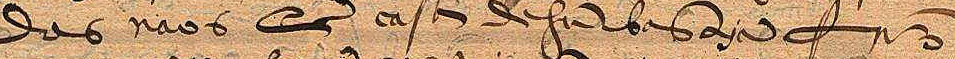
das naos e e̅ casa de hu̅ bastya̅ frz̅
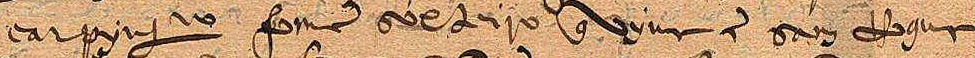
carpyntro home̅ solteiro q̅ vyue e̅ sam Roque
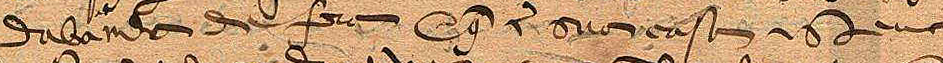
da bamda de fora e q̅ e̅ sua casa esteue
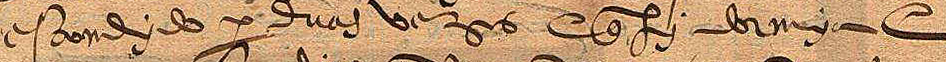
escomdydo ꝓ duas vezes e q̅ hy dormya e
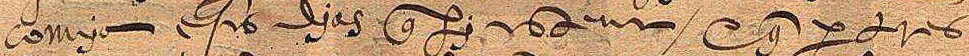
comya eses dyas q̅ hy esteue / e q̅ ꝓ tres
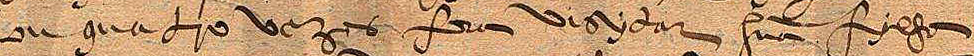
ou quatro vezes fora visytar hu̅a fylha
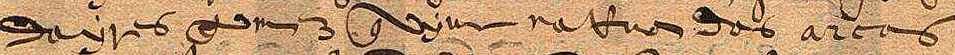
dayres gomez q̅ vyue na Rua das arcas
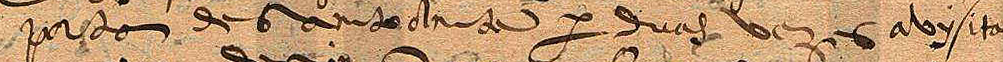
porta de samto Amta̅ ꝑ duas vezes a vysita
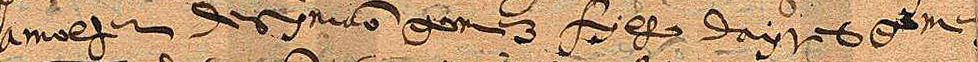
a molher de symão gomez fylho dayres gome
